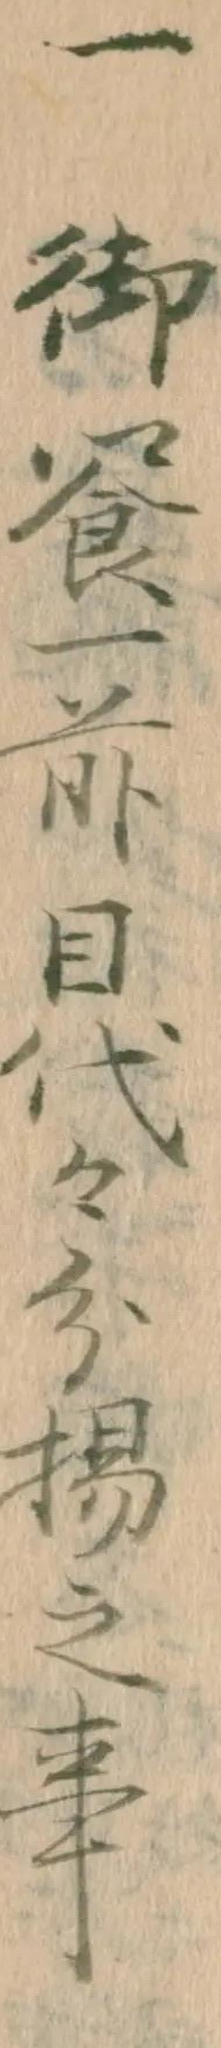一御饗一前目代々分揚之事
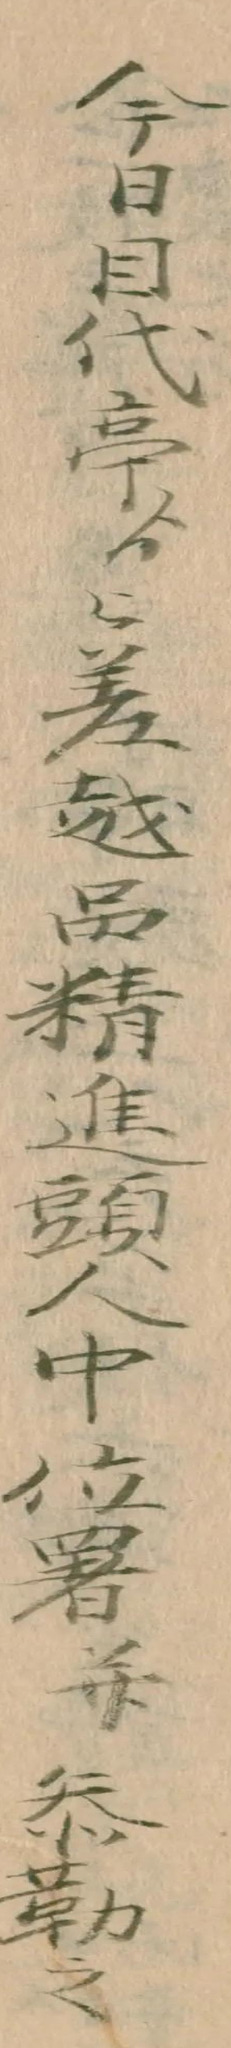一今日目代亭ゟ被差越品精進頭人中位署并参勒之
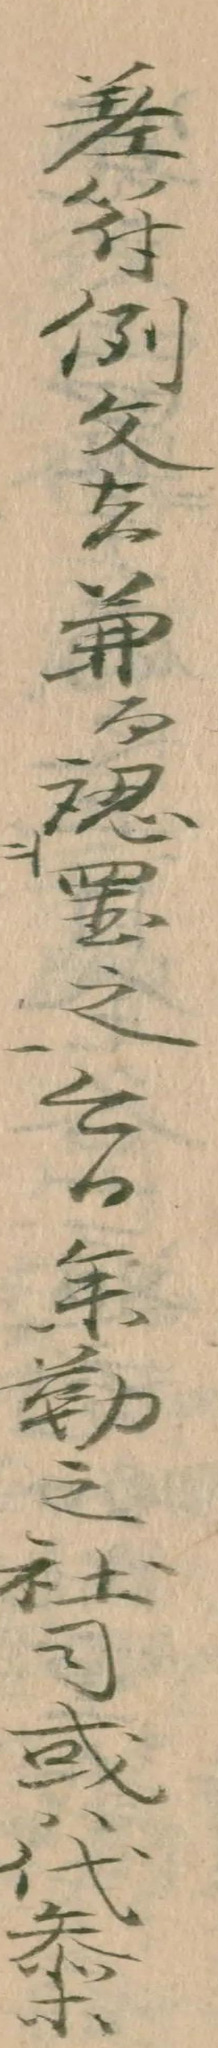一差符例文は兼而認-置之今日参勒之社司或ハ代参等
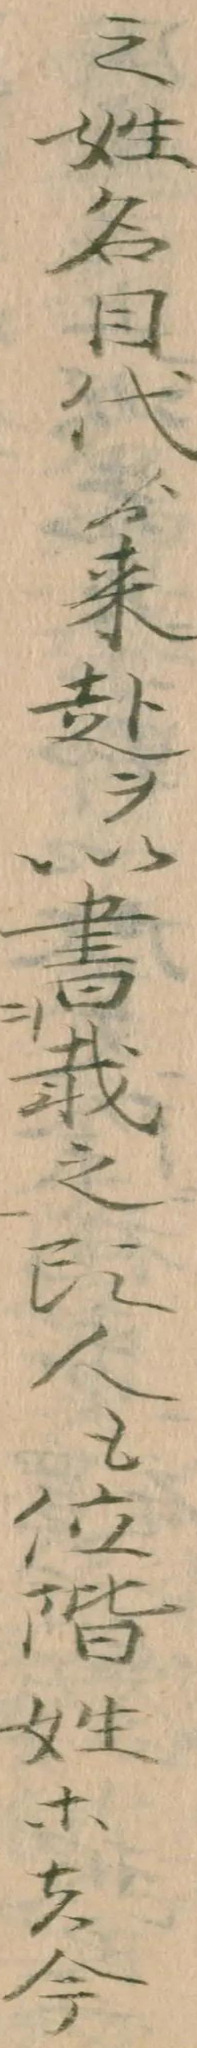之姓名目代ゟ来赴ヲ以書-載之頭人も位階姓等は今
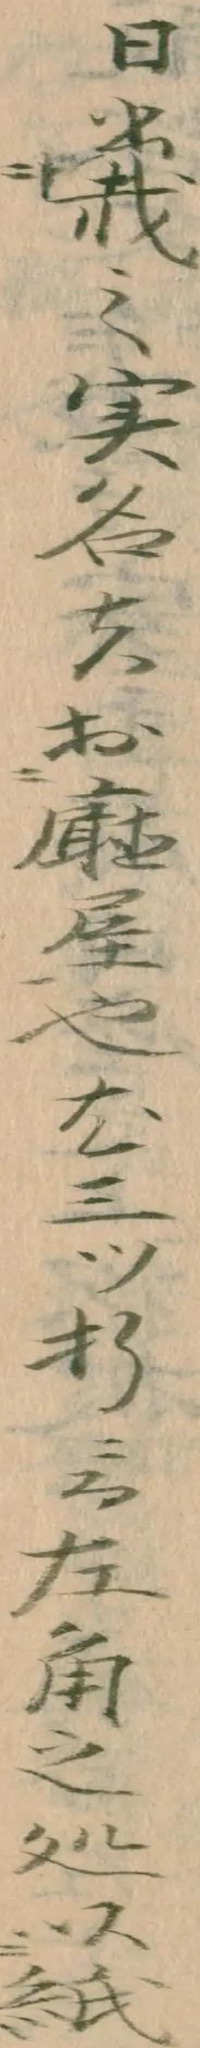日書-載之実名は於庁屋也尤三ツ折ニ而左角之処以紙
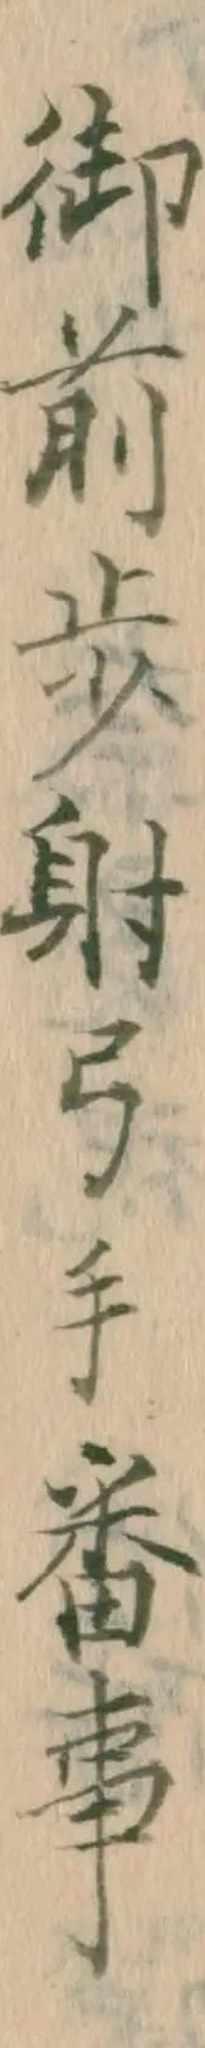定御前歩射弓手番事

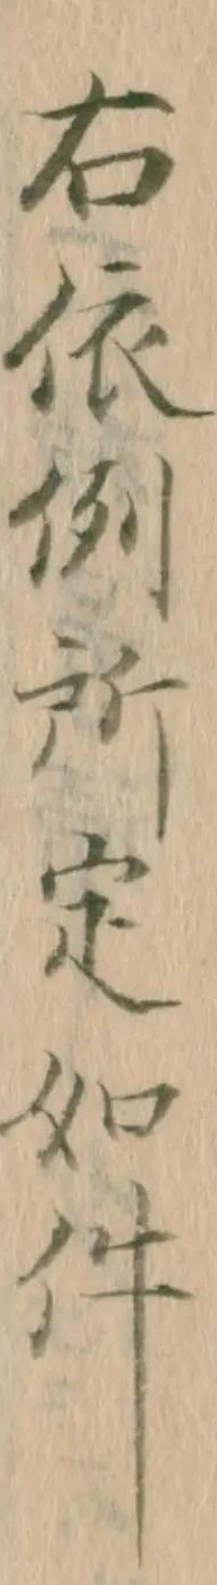右依例所定如件
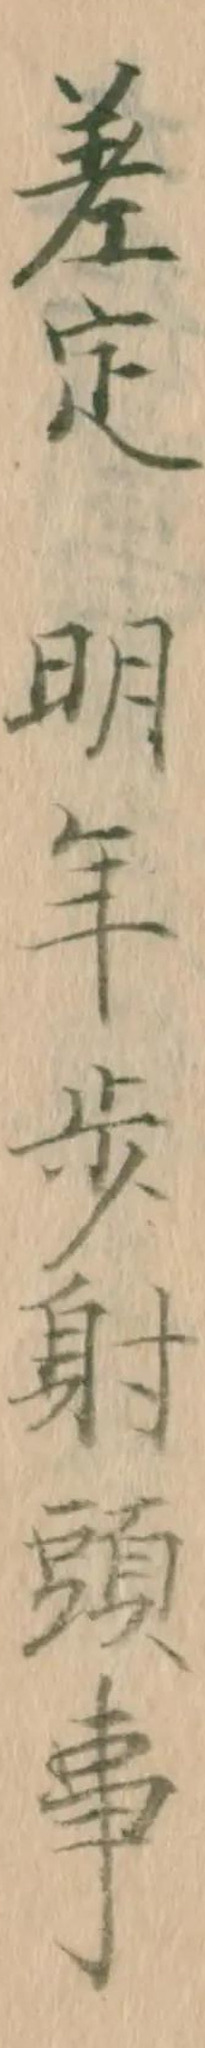差定明年歩射頭事
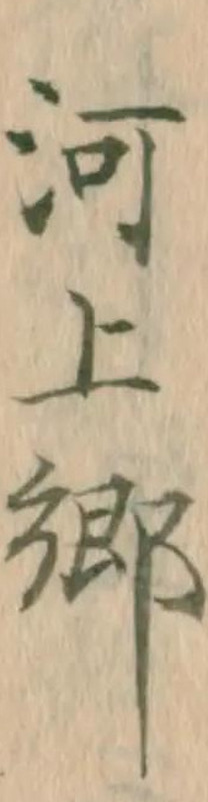河上郷

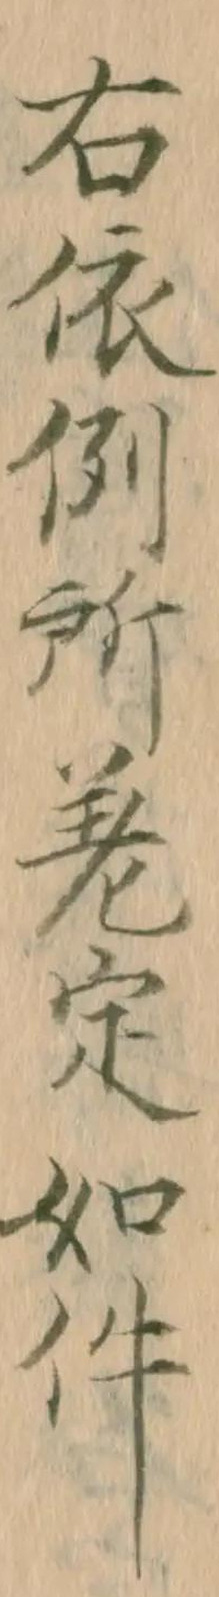右依例所差定如件
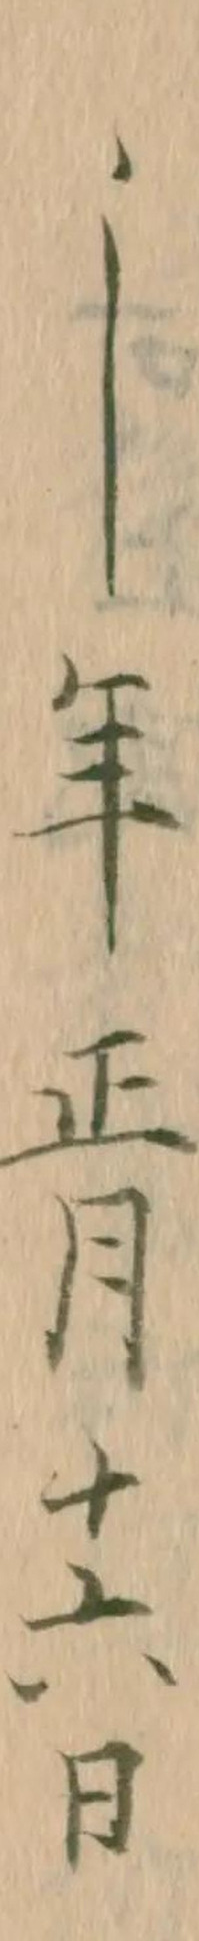――年正月十六日
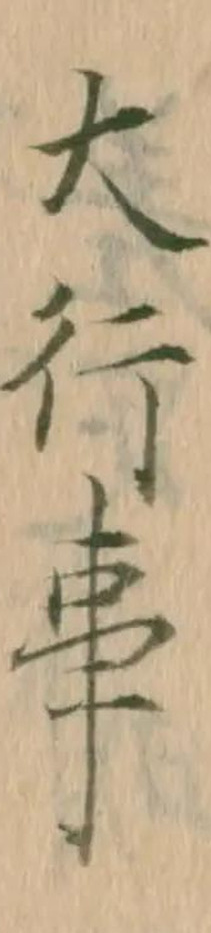大行事
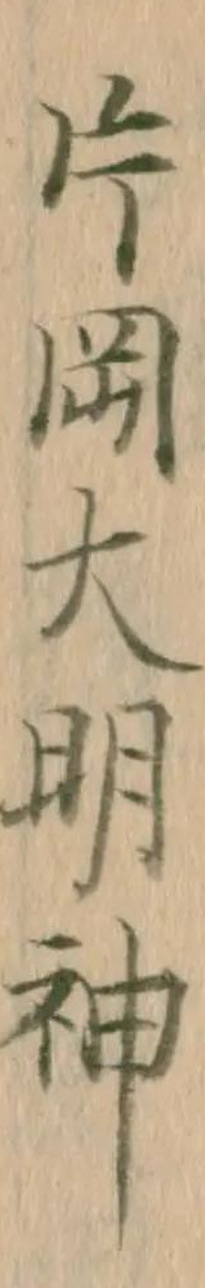片岡大明神
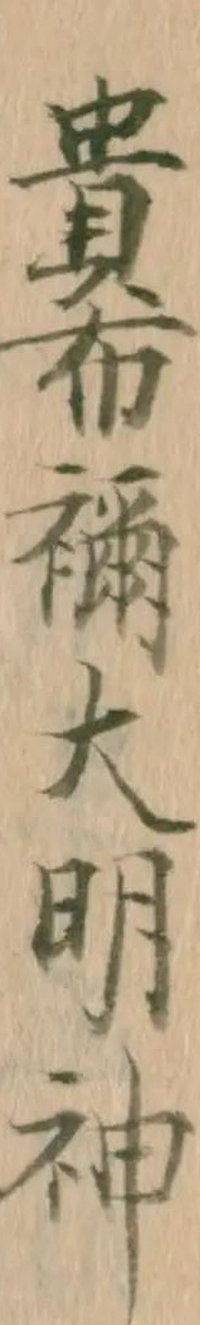貴布祢大明神
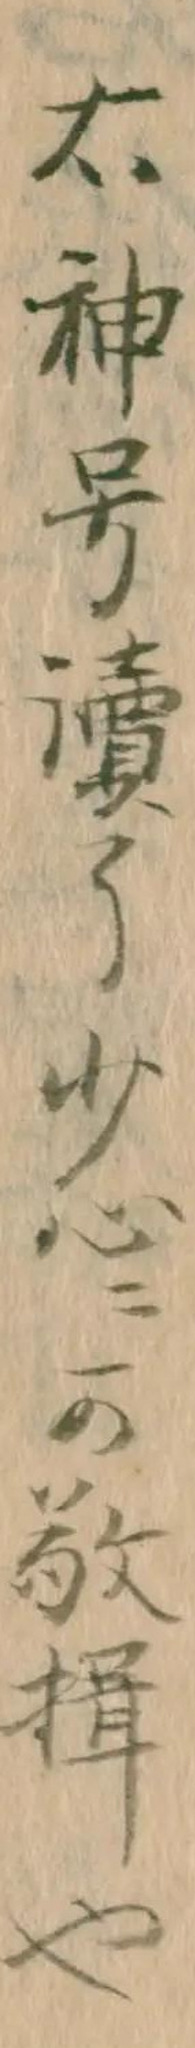右神号読了少心ニ可敬揖也
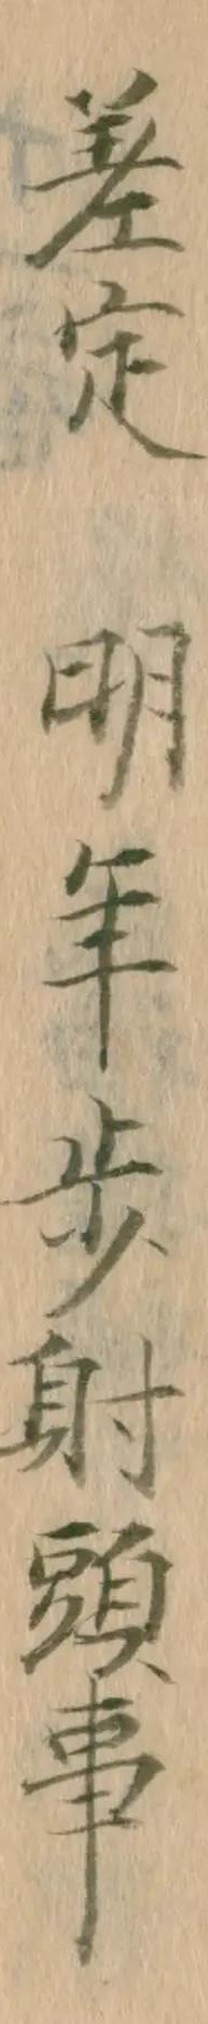差定明年歩射頭事
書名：賀茂社記録. 第26冊
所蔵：国立国会図書館 National Diet Library, JAPAN
